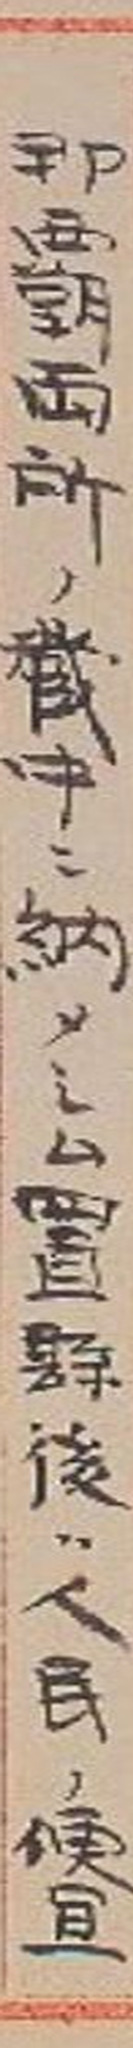那覇両所ノ蔵中ニ納メシム置県後ハ人民ノ便宜
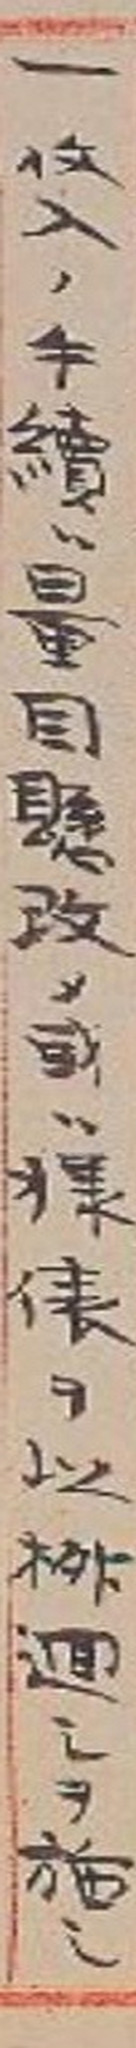一収入ノ手続ハ量目懸改メ或ハ様俵ヲ以枡廻シヲ施シ
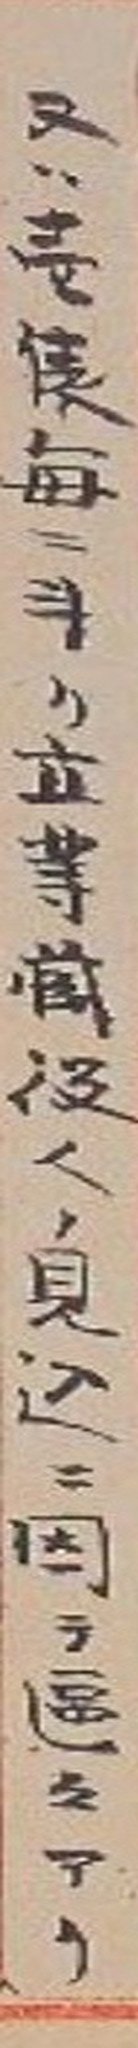又ハ壱俵毎ニ斗リ立等蔵役人ノ見込ニ因テ区々アリ
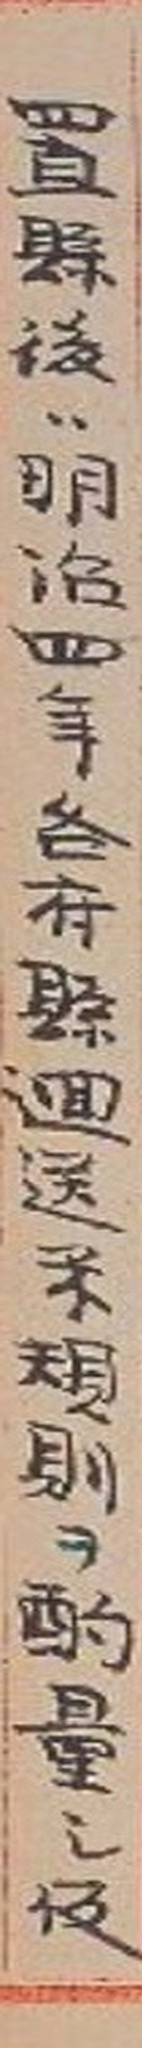置県後ハ明治四年各府県廻送米規則ヲ酌量シ仮

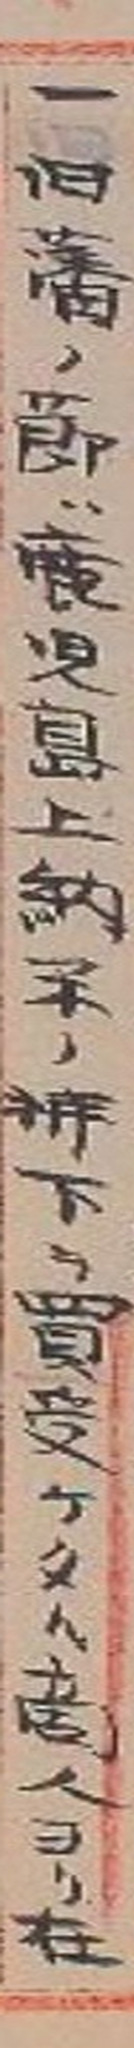一旧藩ノ節ハ鹿児島上納米ノ払下ヲ買受ケタル商人ヨリ在
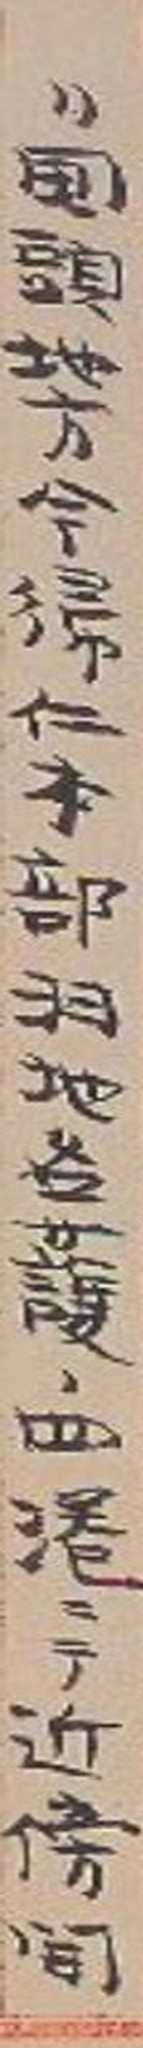リ国頭地方今帰仁本部羽地名護ノ四港ニテ近傍間
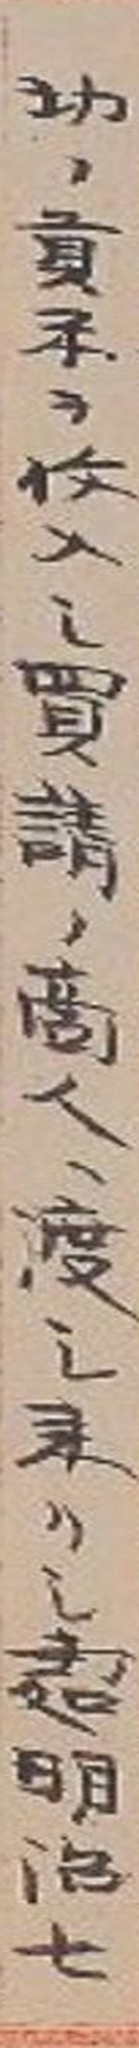切ノ貢米ヲ収入シ買請ノ商人ヘ渡シ来リシ処明治七
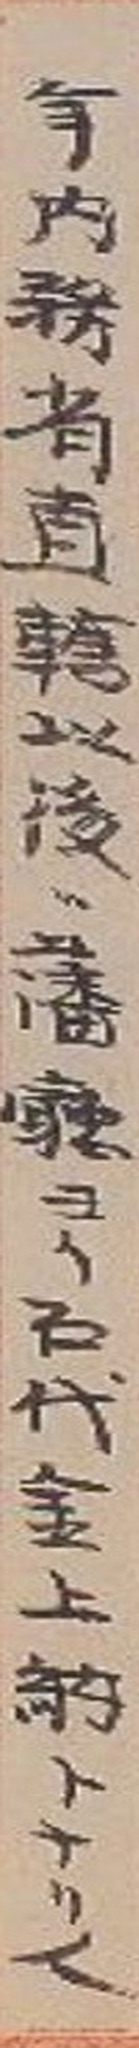年内務省直轄以後ハ藩庁ヨリ石代金上納トナリ人
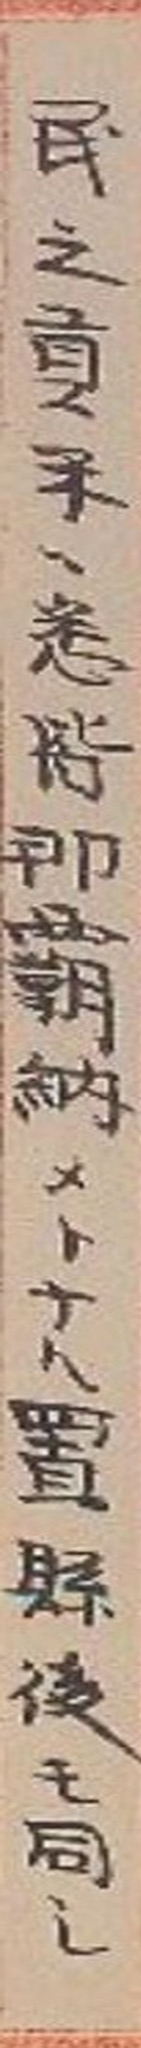民之貢米ハ悉皆那覇納メトナル置県後モ同シ
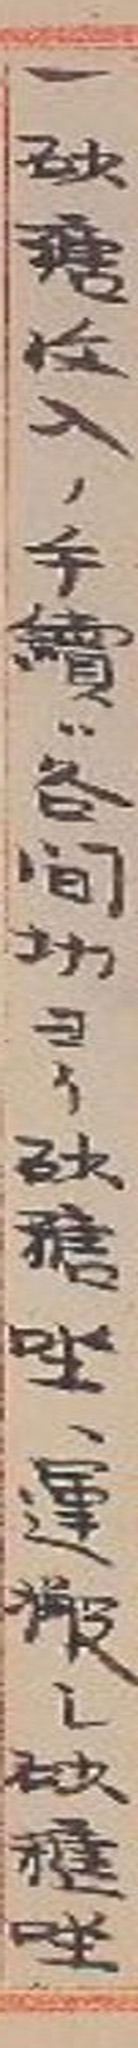一砂糖収入ノ手続ハ各間切ヨリ砂糖坐ヘ運搬シ砂糖坐
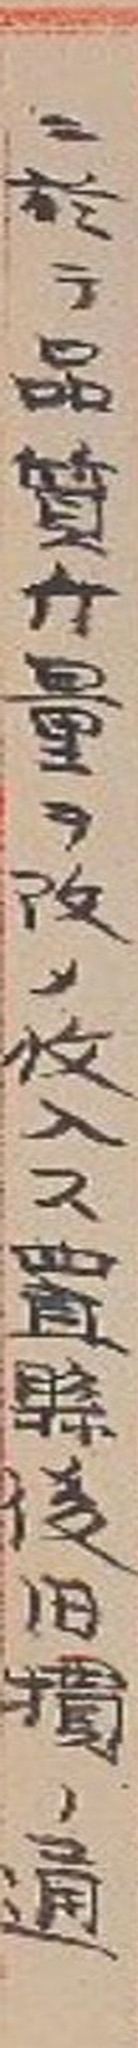ニ於テ品質斤量ヲ改メ収入ス置県後旧慣ノ通
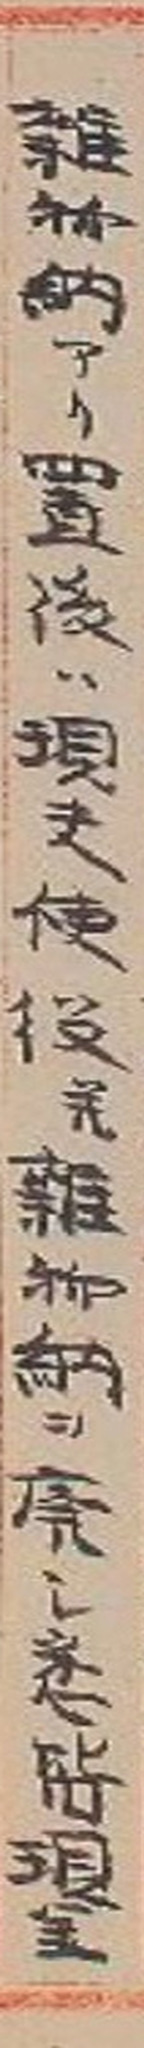雑物納アリ置後ハ現夫使役并雑物納ヲ廃シ悉皆現金
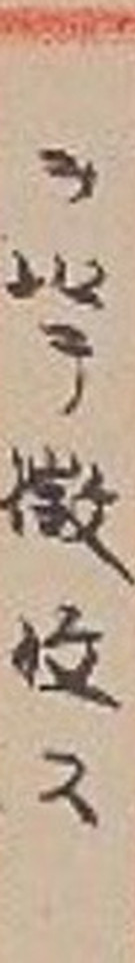ヲ以テ徴収ス
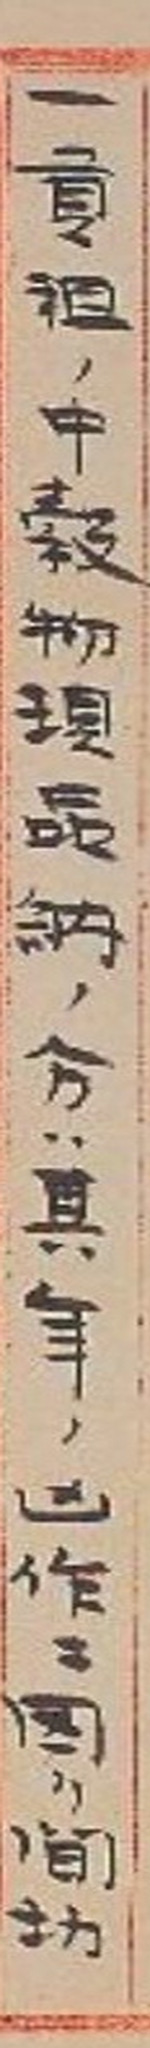一貢租ノ中穀物現品納ノ分ハ其年ノ凶作ニ因リ間切
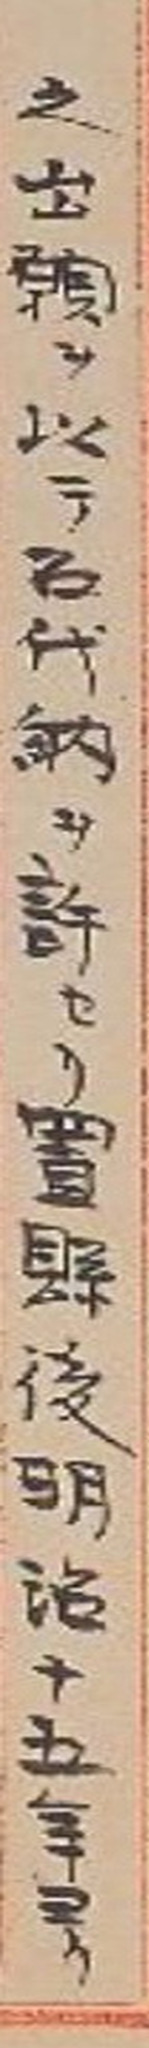之出願ヲ以テ石代納ヲ許セリ置県後明治十五年ヨリ
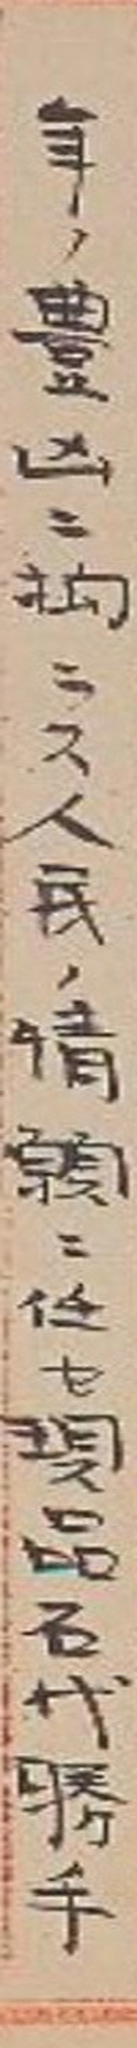年ノ豊凶ニ拘ラス人民ノ情願ニ任セ現品石代勝手
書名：貢納物品領収旧藩慣例並ニ置県後取扱順序
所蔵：University of the Ryukyus Library
